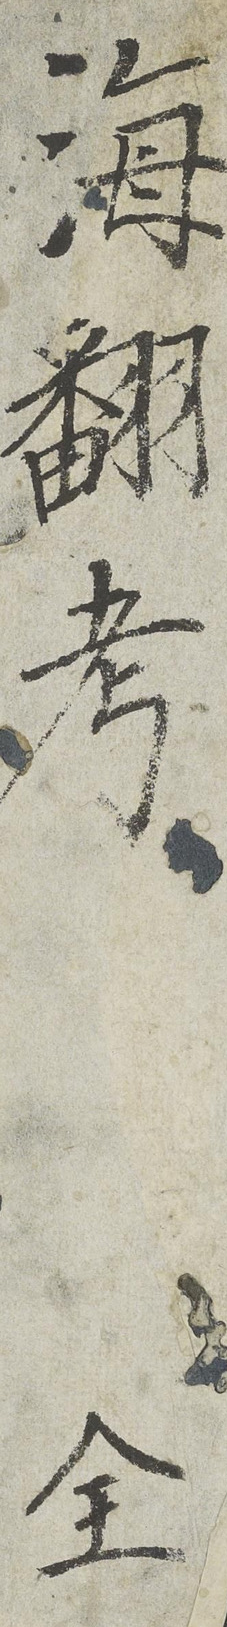海翻考全

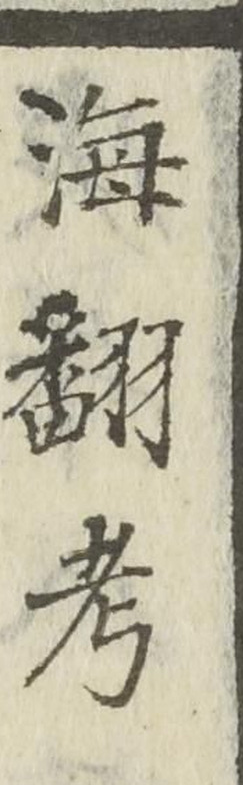海翻考
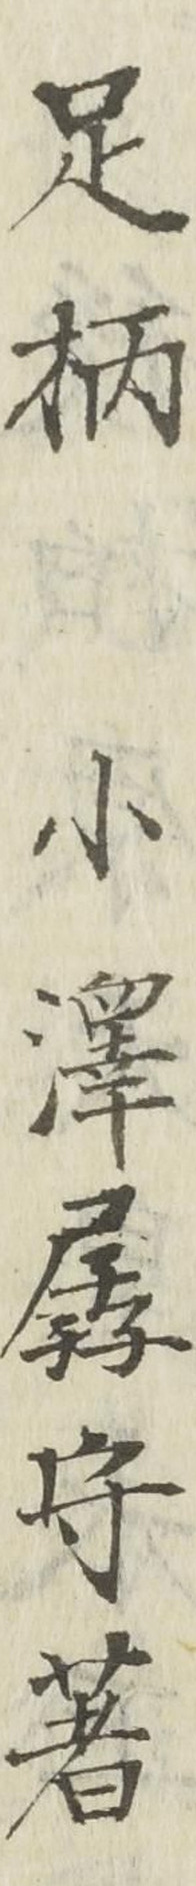足柄小沢孱守著
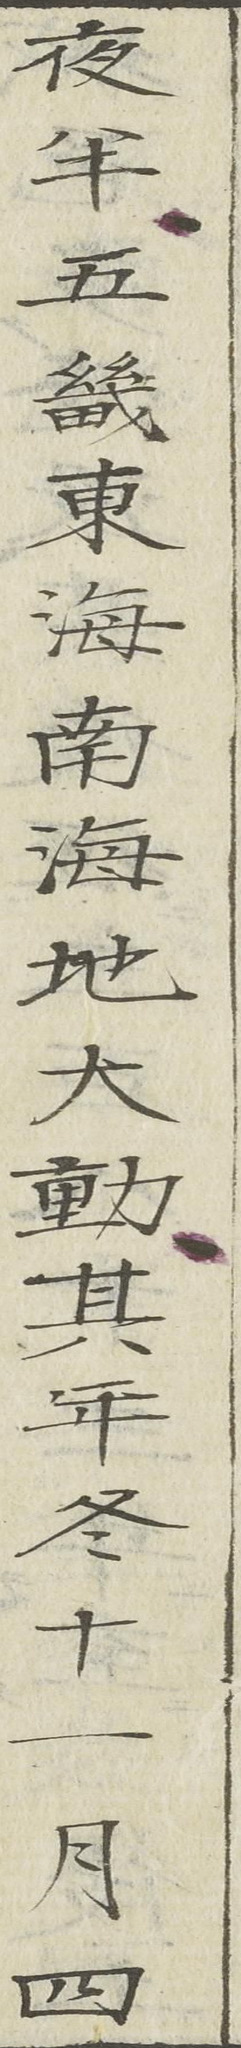夜年、五畿東海南海地動、其年冬十一月四
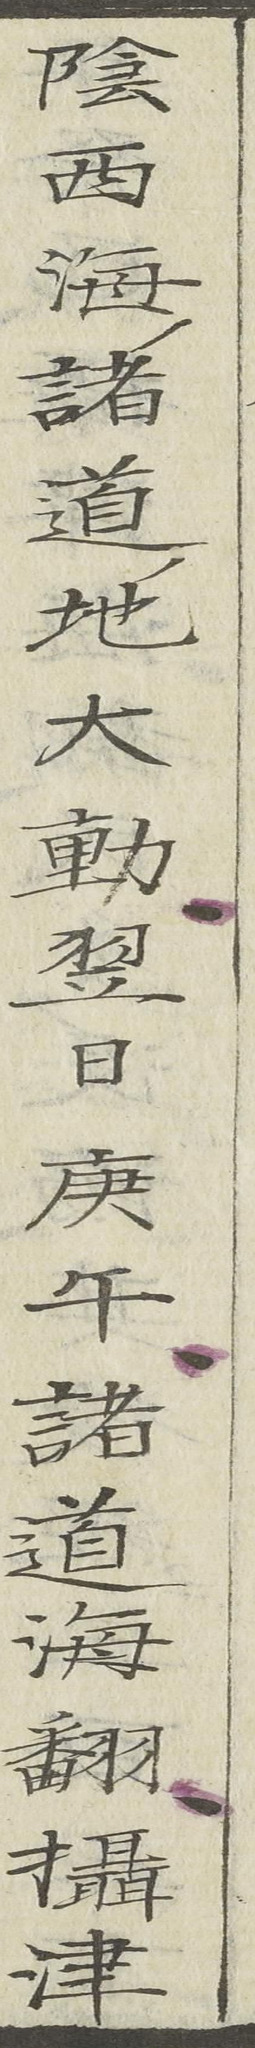陰西海諸道地大動、翌日庚午、諸道海翻、摂津
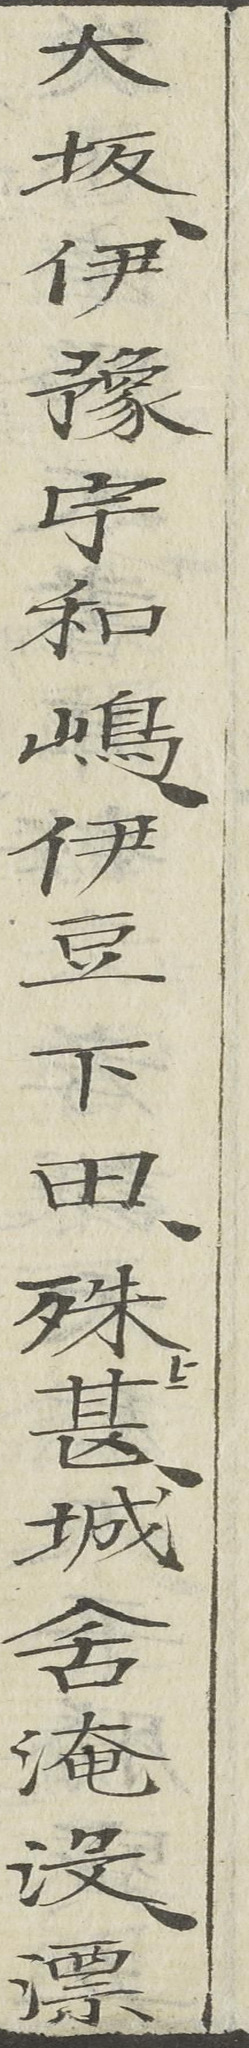大坂、伊豫宇和嶋、伊豆下、殊甚、城舍淹没、漂

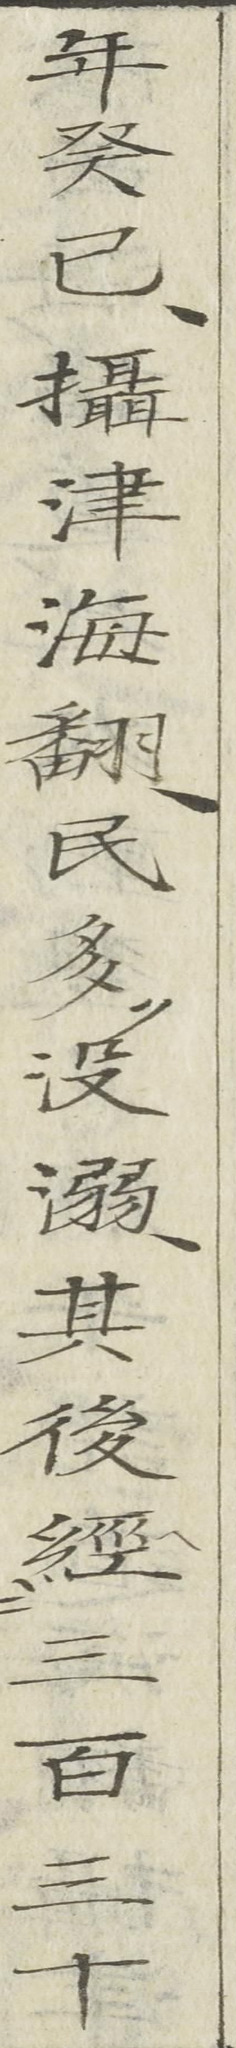年癸巳、摂津海翻、民多没溺、其後経三百三十
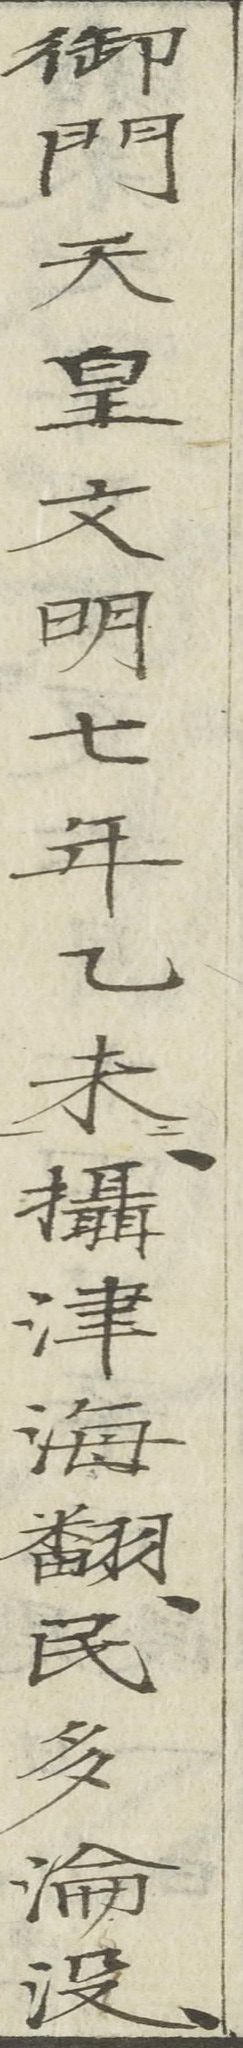御門天皇文明七年乙未、摂津海翻、民多淪没、
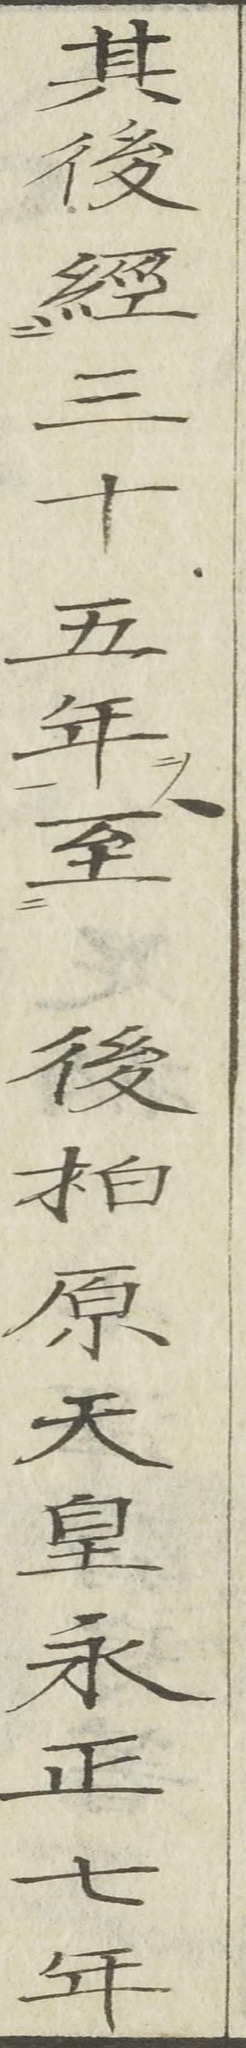其後経三十五年、至後柏原天皇永正七年
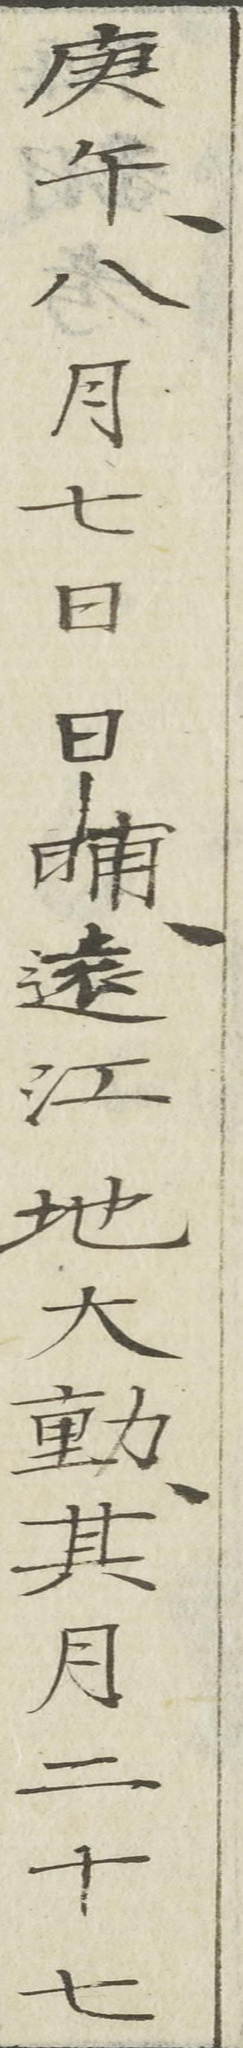庚午、八月七日日晡、遠江地大動、其月二十七

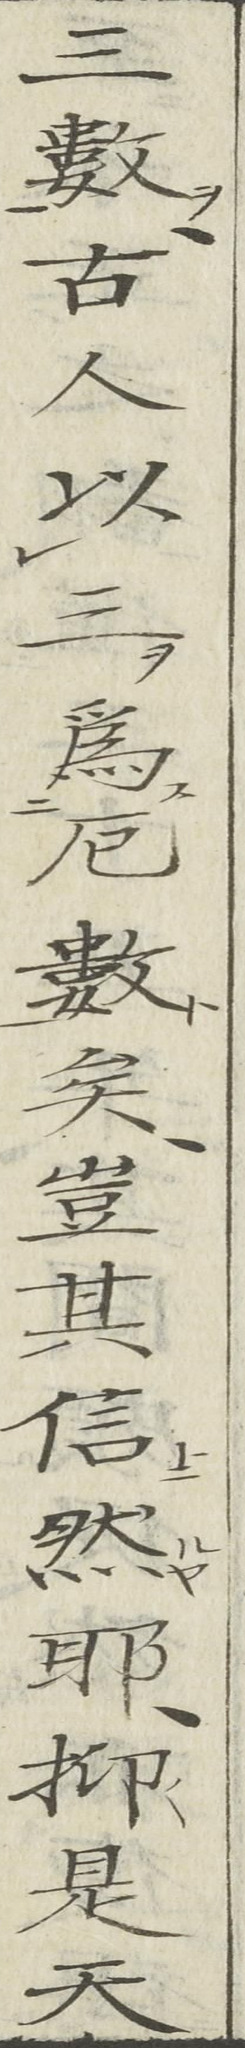三数、古人以三為厄数矣、豈其信然耶、抑是天
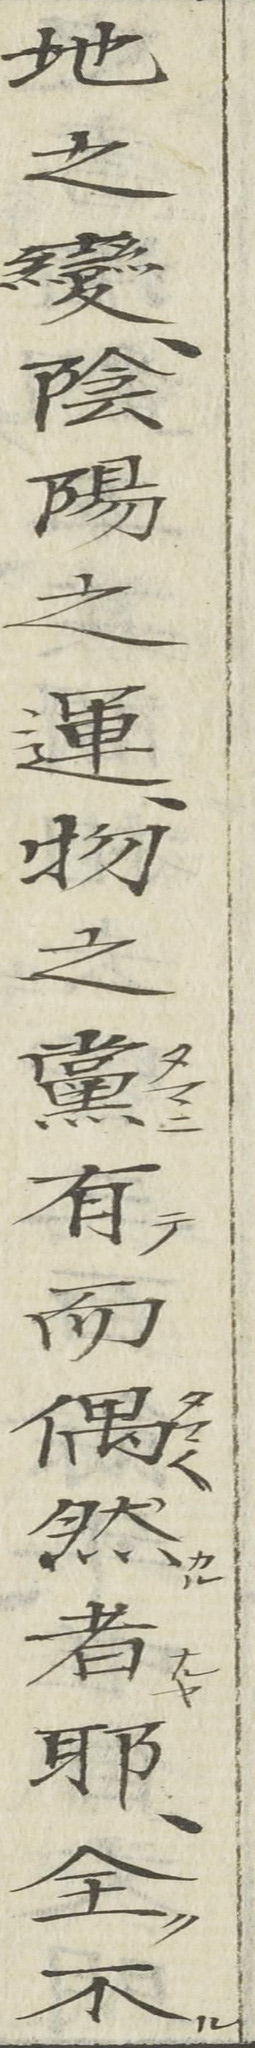地之変、陰陽之運、物之党有而偶然者耶、全不
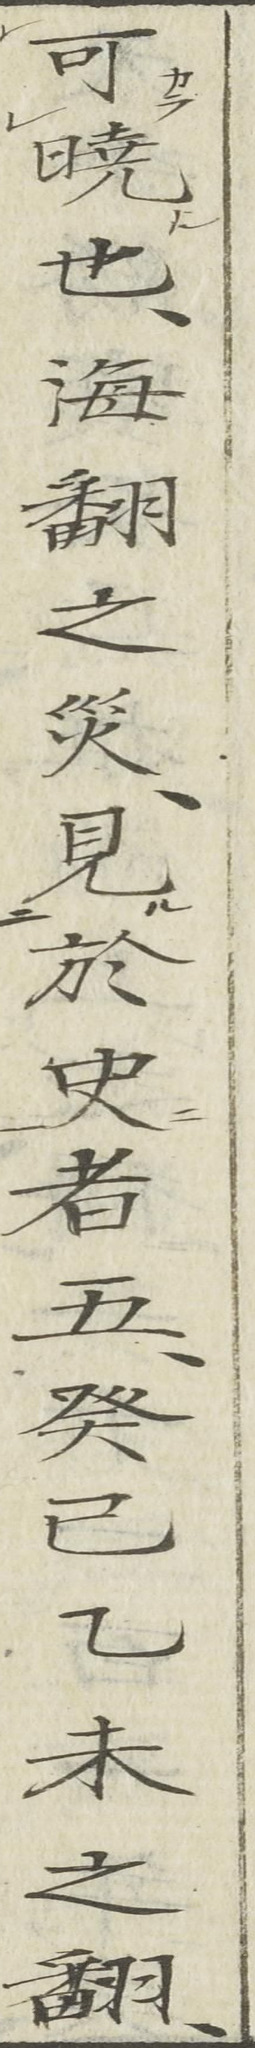可暁也、海翻之災、見於史者五、癸巳乙未之翻
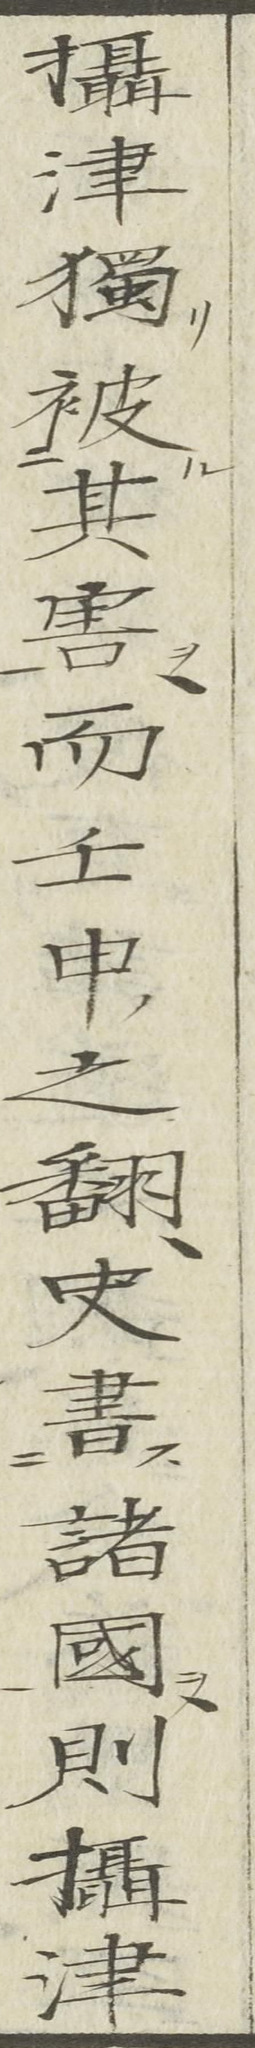摂津独被其害、而壬申之翻、史書諸国、則摂津
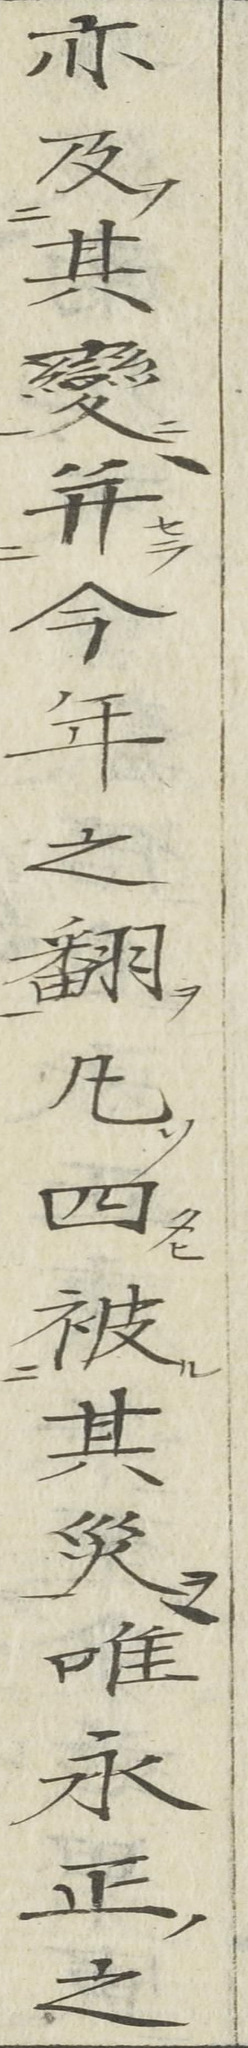亦及其変、并今年之翻凡四被其災、唯永正之
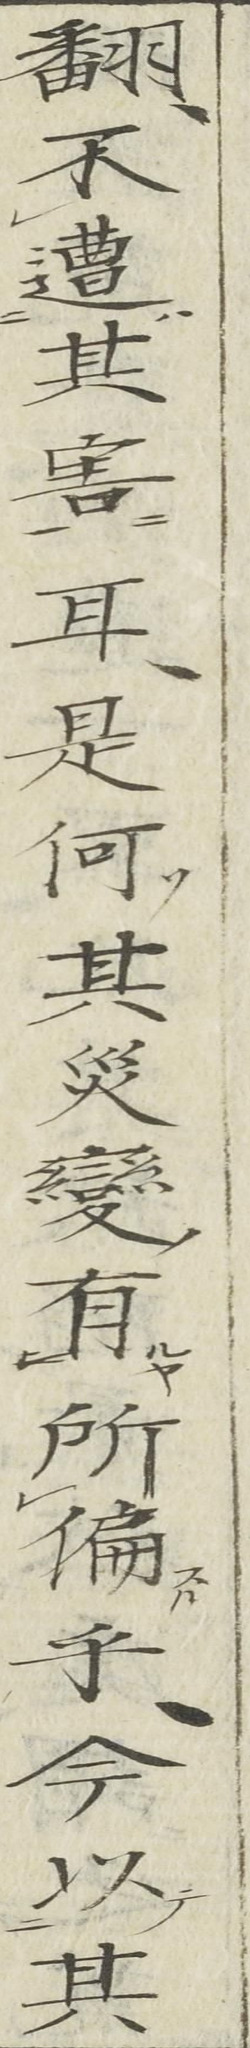翻不遭其害耳、是何其災変有所偏乎、今以其
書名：海翻考　全
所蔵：東京大学地震研究所図書室 Earthquake Research Institute Library, The University of Tokyo, JAPAN
